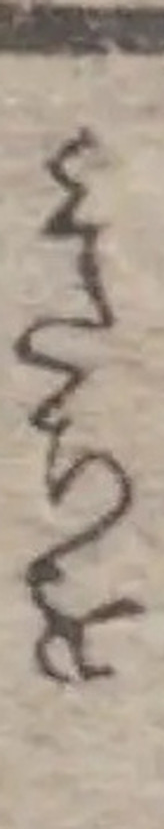みたちを
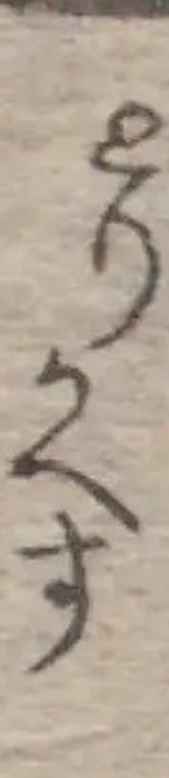とりかへす

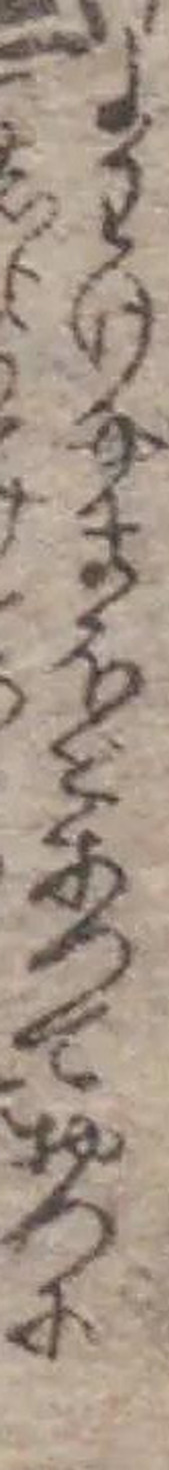しよわけやまほとあつておつに
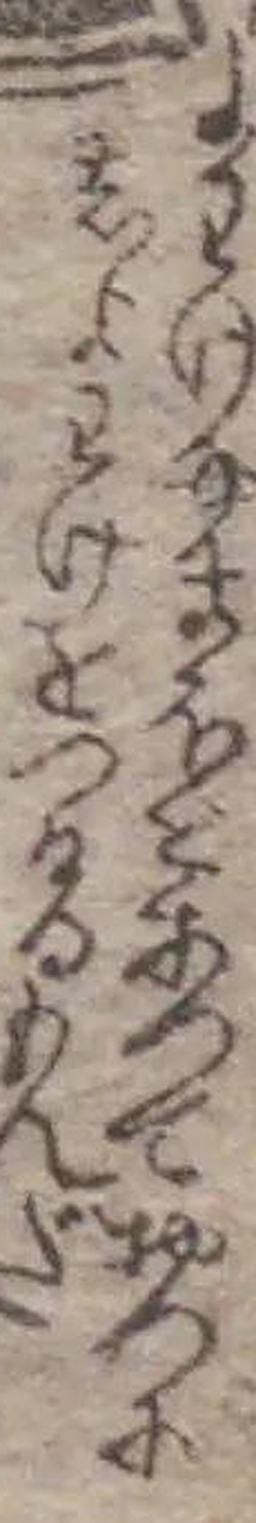しよわけをつけるもんだ
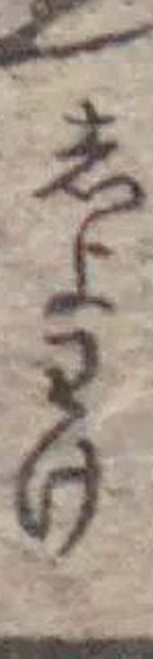しよわけ
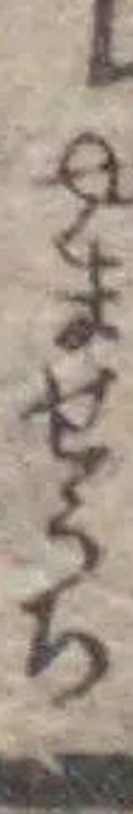やませうち
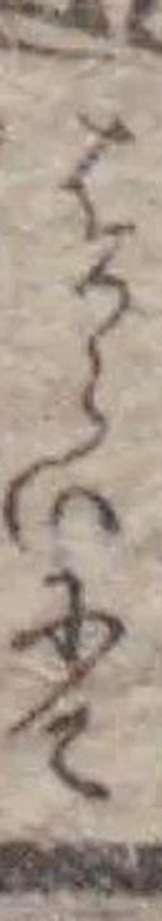はからいにて
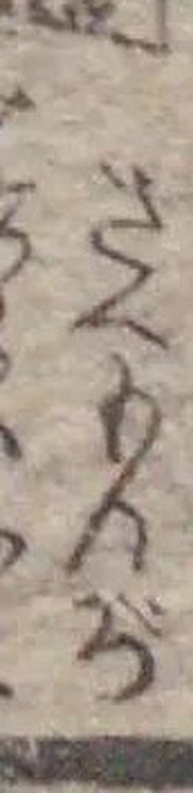さへもんが
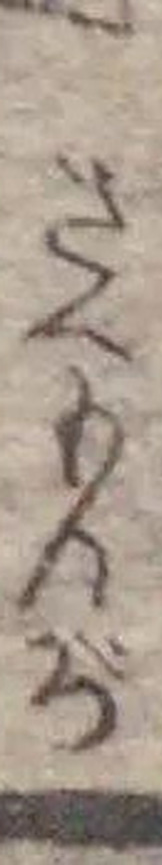さへもんが
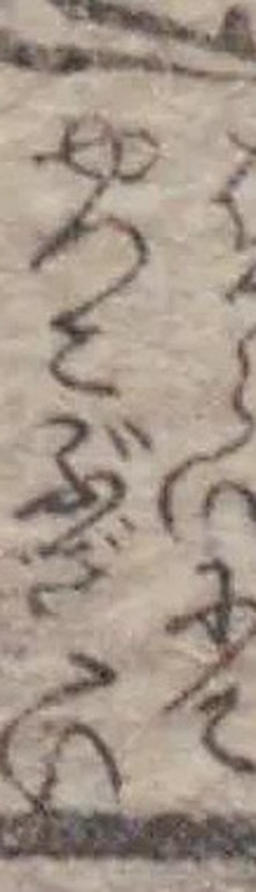やつとぶざへい
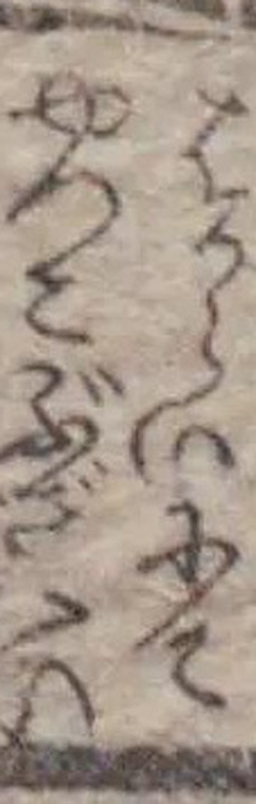やつとぶざへい
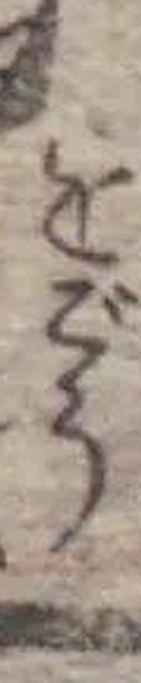をごう
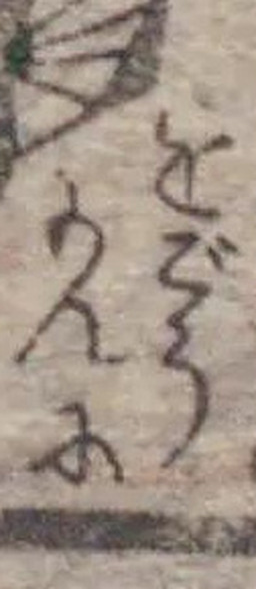もんに
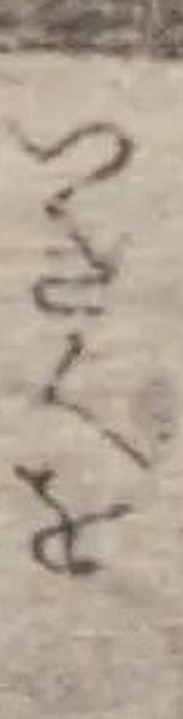いき人を
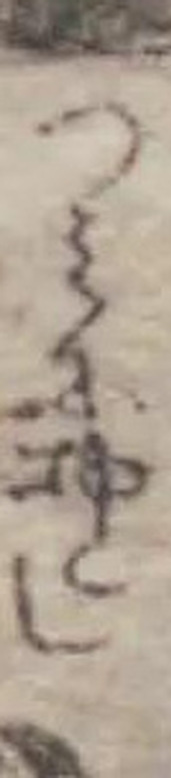つみにおとし
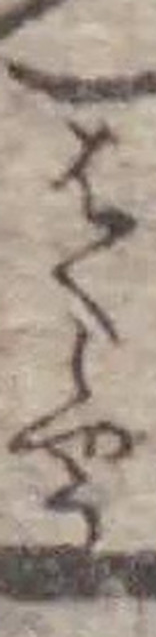はくしやう
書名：富多高慢噺 3巻
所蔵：国立国会図書館 National Diet Library, JAPAN
